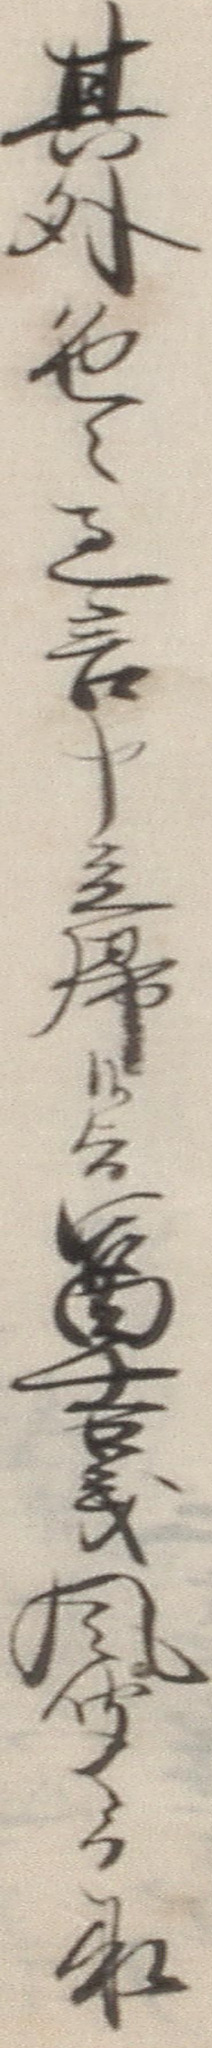其外色々過言申立帰候旨富吉義風聞ニ而承
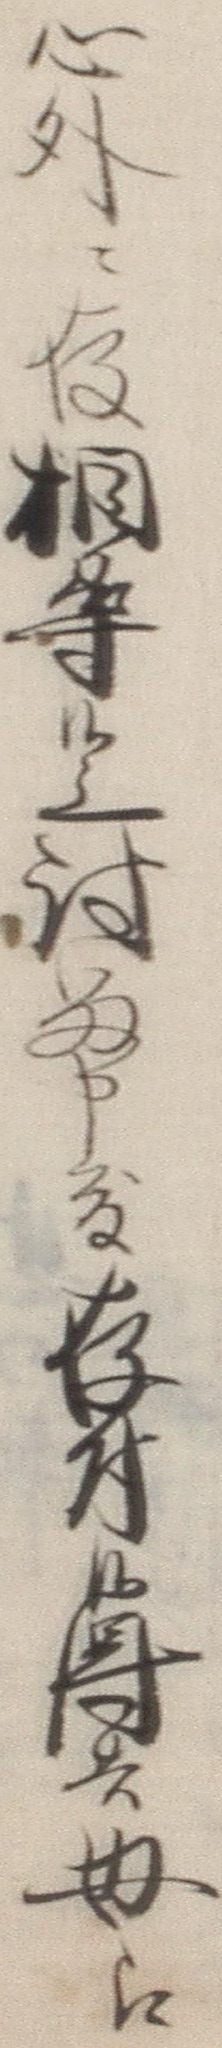心外ニ存相尋候上討留申度存付候得共母え
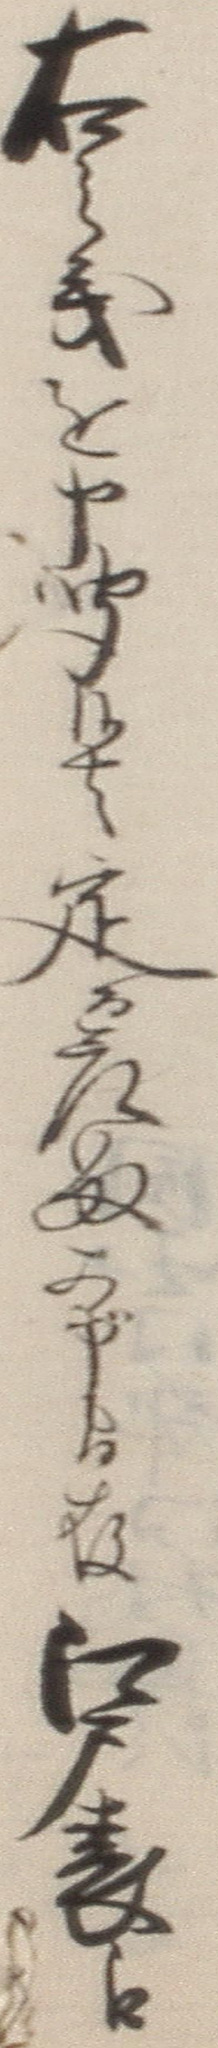右之義を申聞候は定而差留可申旨存江戸表え
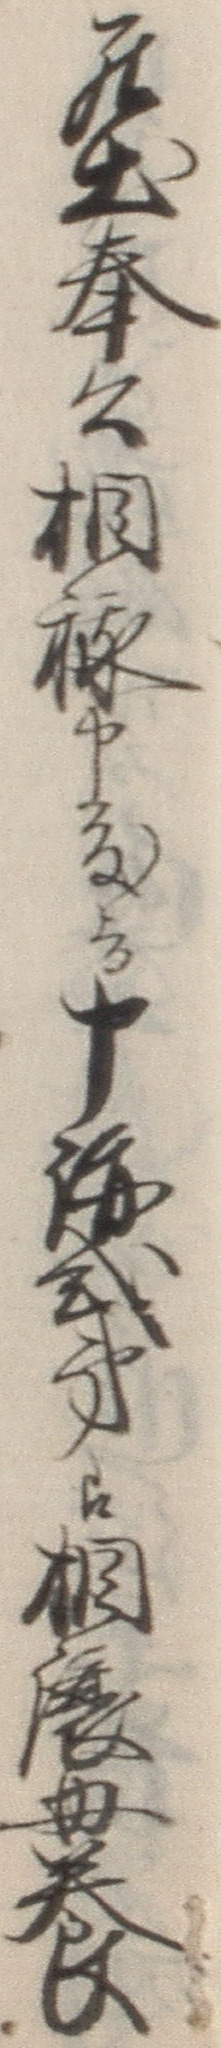罷出奉公相稼申度旨申跡式弟え相譲母養
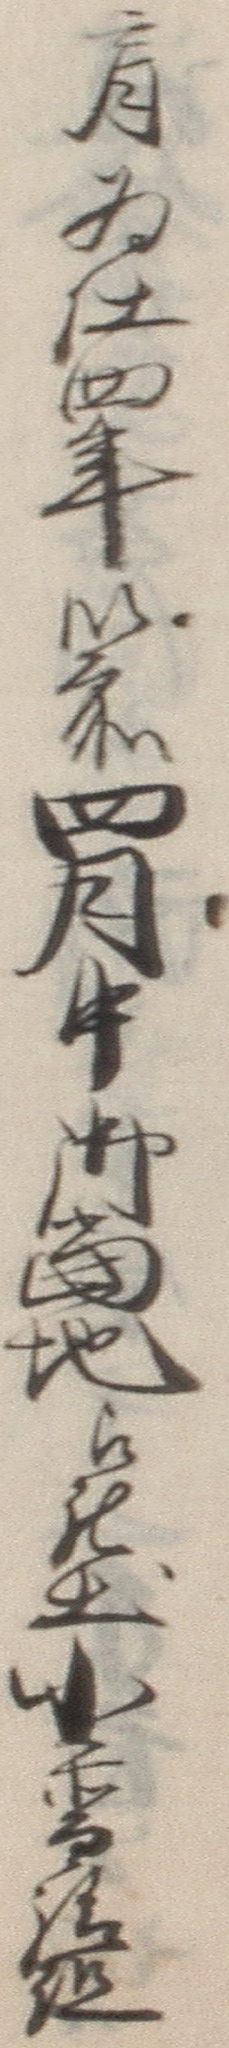育為仕四年以前四月中御当地え罷出小普請組
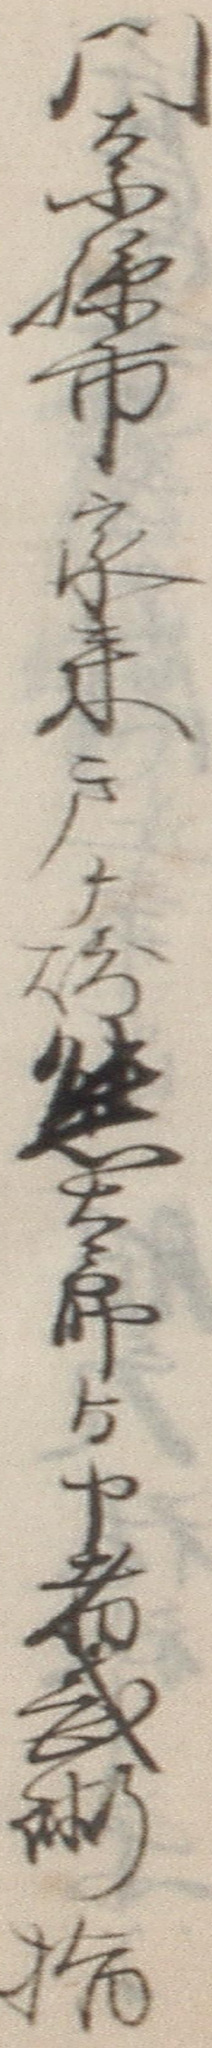門奈孫市家来戸ナ崎熊太郎と申者武術指
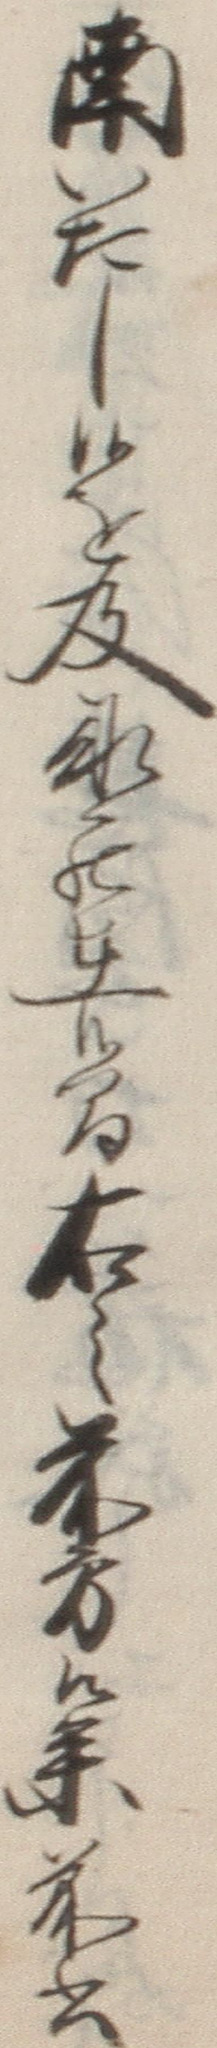南いたし候を及承罷在候間右之前方え参前書
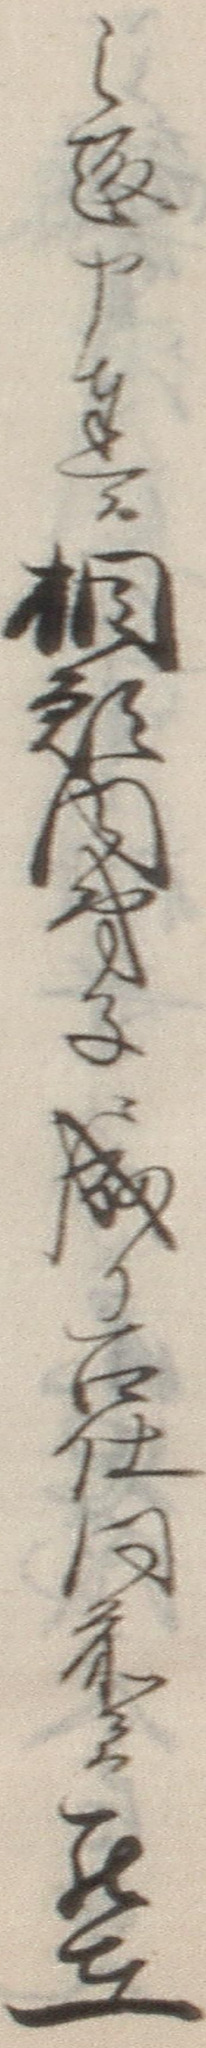之趣申達而相願内弟子ニ成り召仕同前ニ而罷在
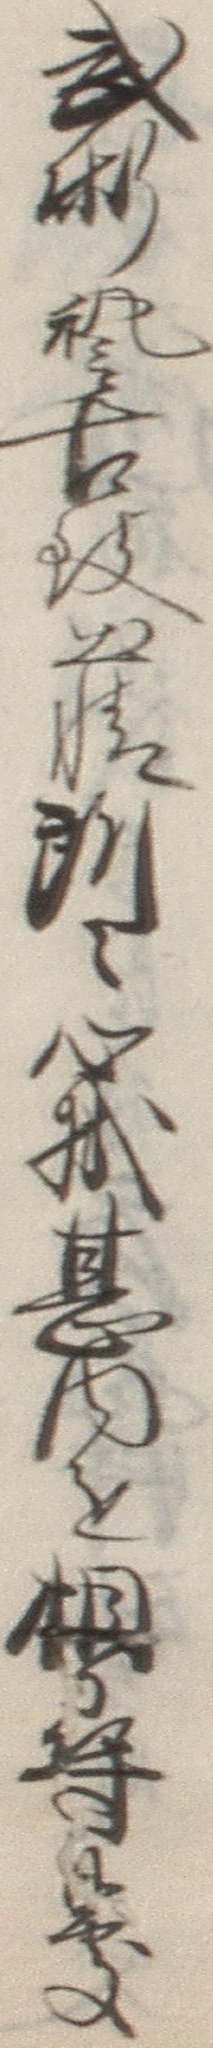武術稽古致出情所々心掛甚内を相尋候処
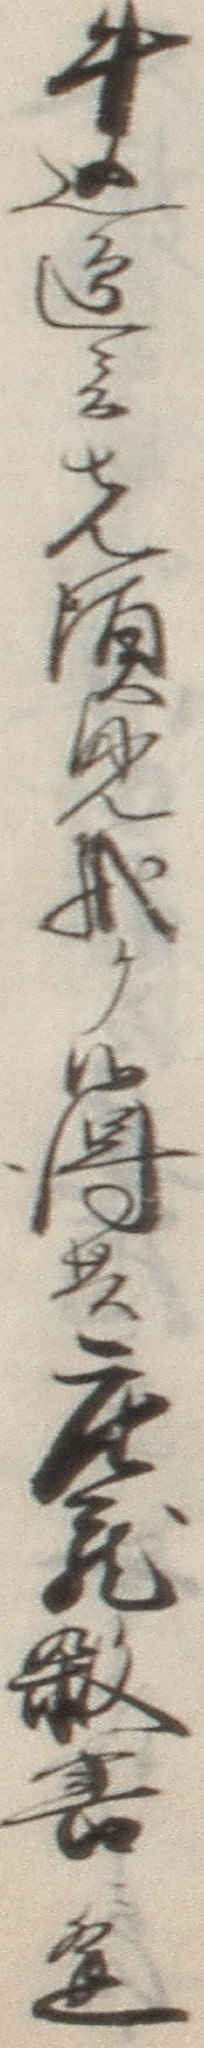牛込辺ニ而先頃見掛ケ候得共庄蔵殺害ニ逢
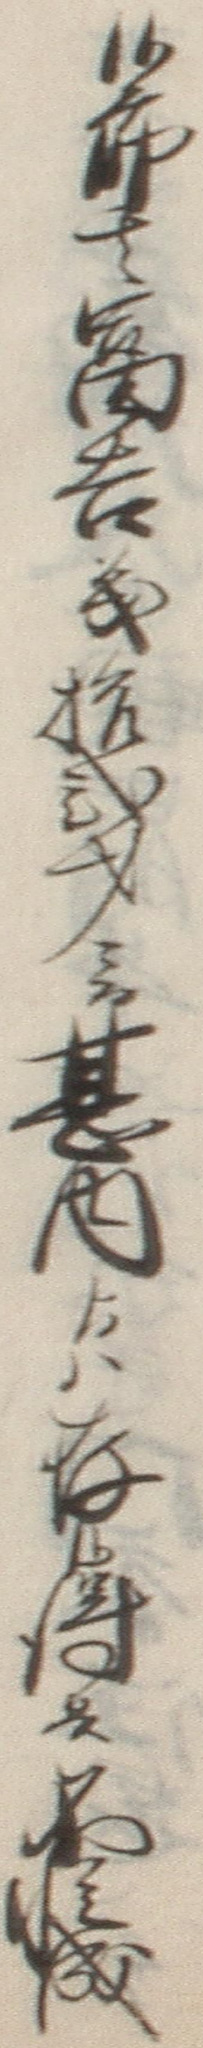候節は富吉義拾弐才ニ而甚内とハ存候得共不慥成
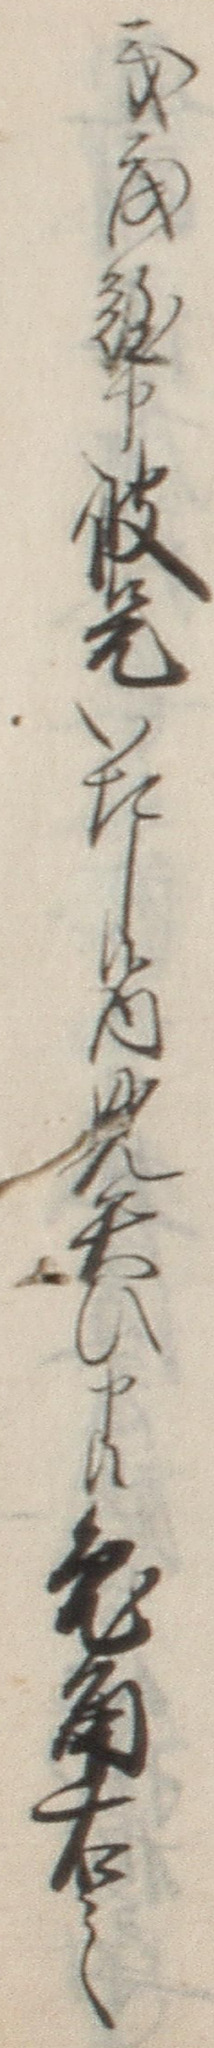義も難申彼是いたし候内見失ひ申候兎角右之

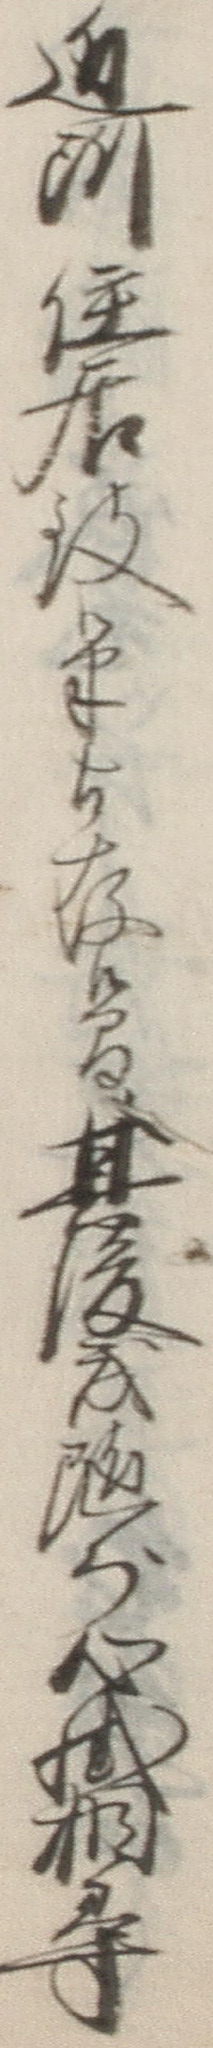近所住居致候半と存候間其後も随分心掛相尋
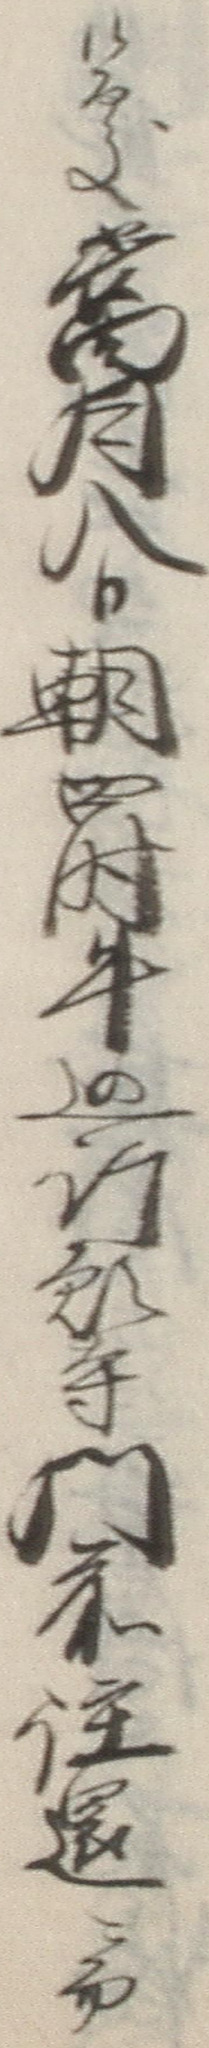候処当月八日朝四時牛込行願寺門前往還ニ而
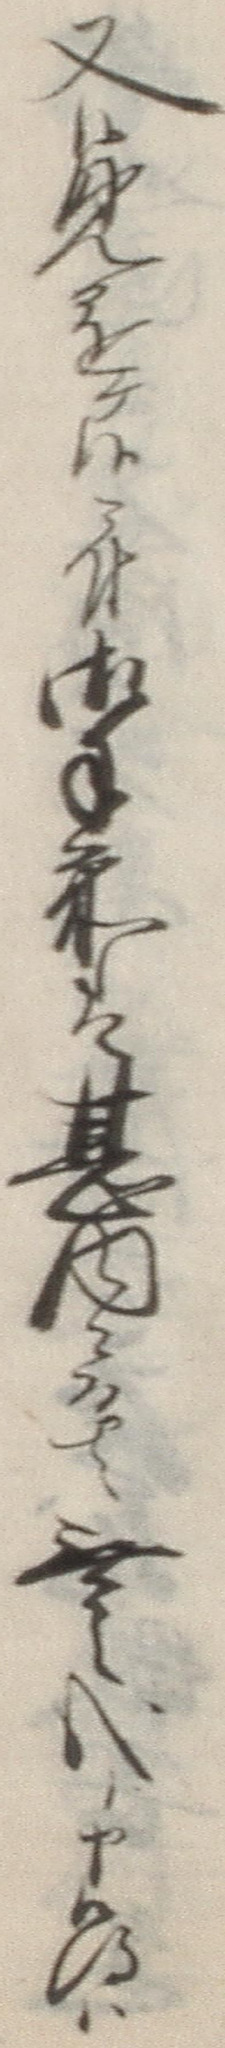又候見懸ケ候ニ付御手前は甚内ニ而は無之哉申候得ハ
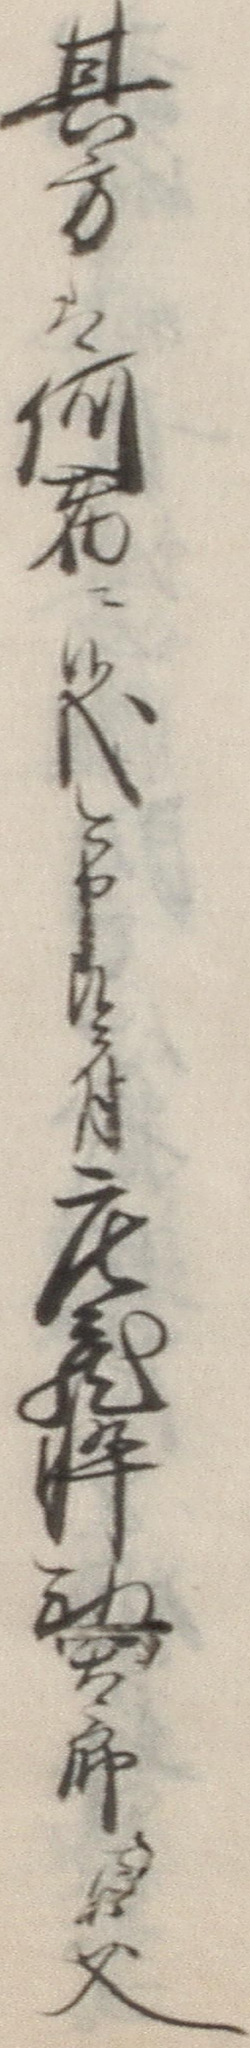其方は何者ニ候哉と申候ニ付庄蔵倅初太郎ニ而父
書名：[諸国災害記録]
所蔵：東京大学地震研究所図書室 Earthquake Research Institute Library, The University of Tokyo, JAPAN
